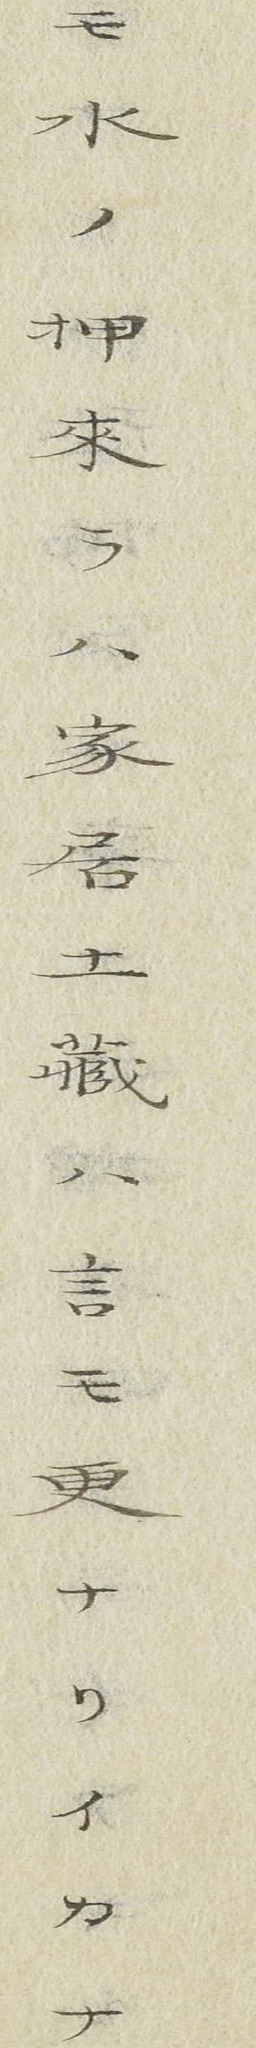モ水ノ押来ラハ家居土蔵ハ言モ更ナリイカナ
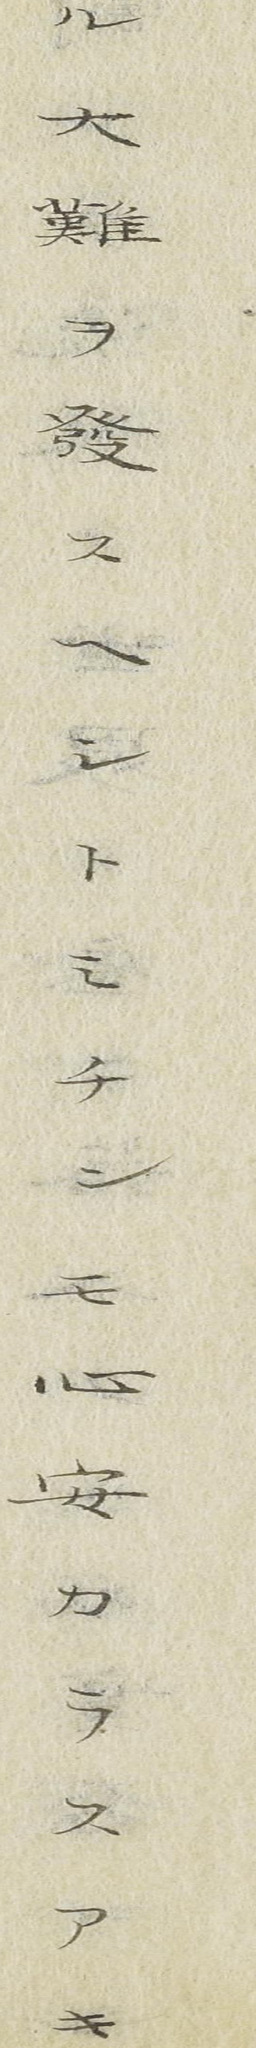ル大難ヲ発スヘシトミチンモ心安カラスアキ
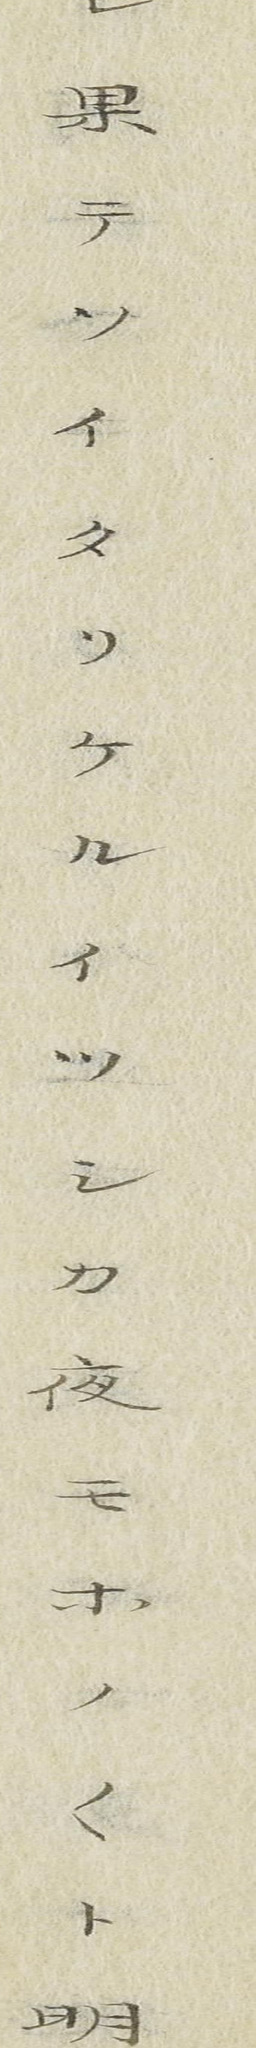レ果テソイタリケルイツシカ夜モホノ〱ト明
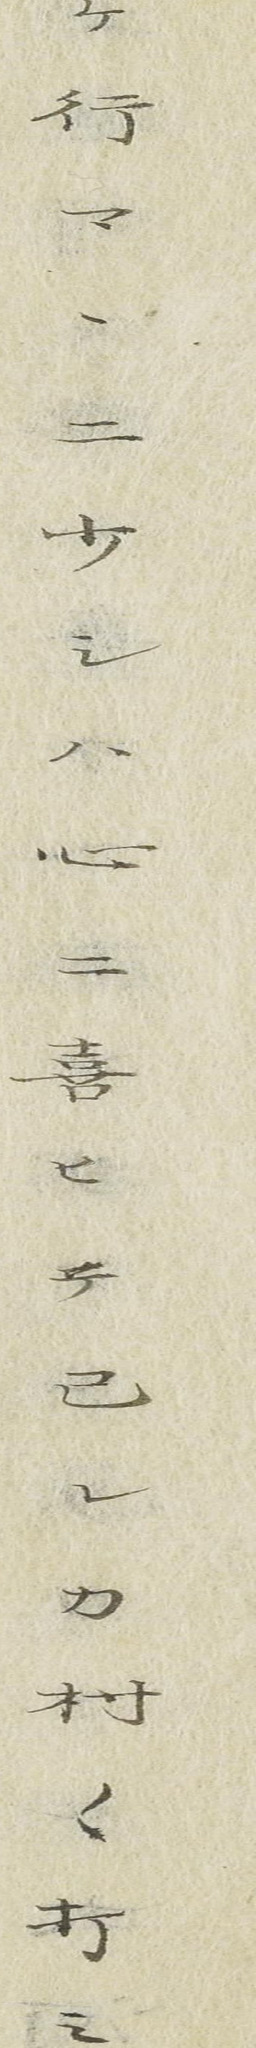ケ行マヽニ少シハ心ニ喜ヒテ己レカ村〱打ミ
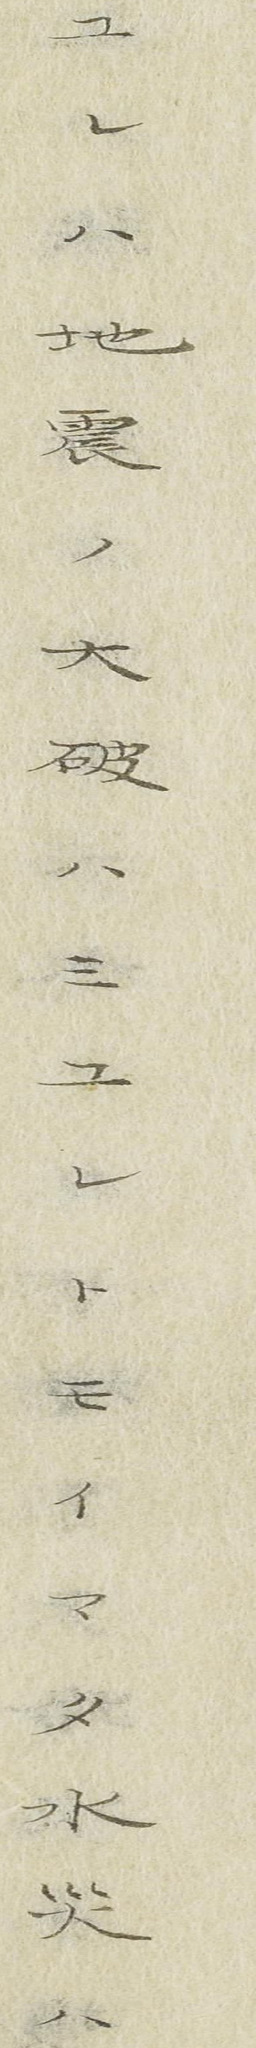ユレハ地震ノ大破ハミユレトモイマタ水災ハ
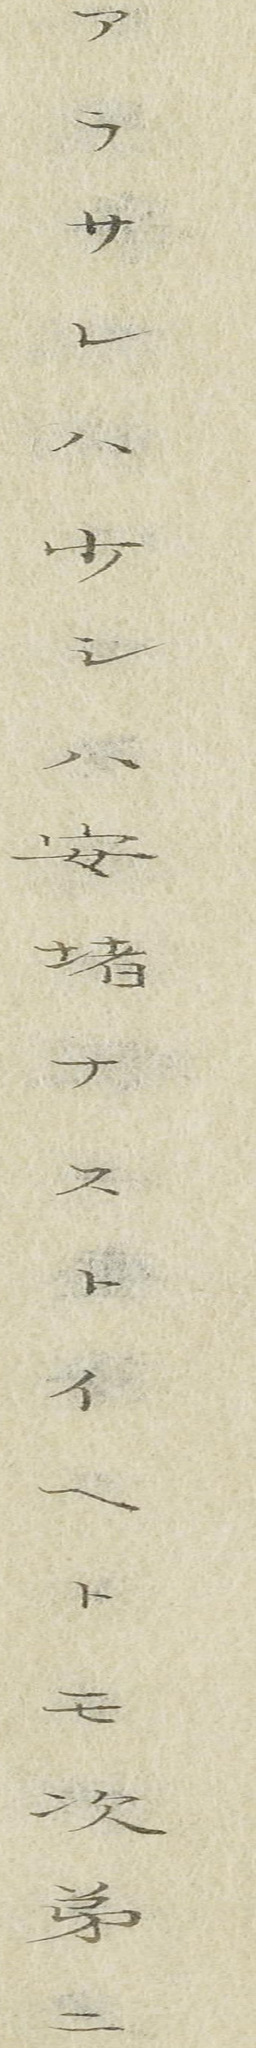アラサレハ少シハ安堵ナストイヘトモ次第ニ
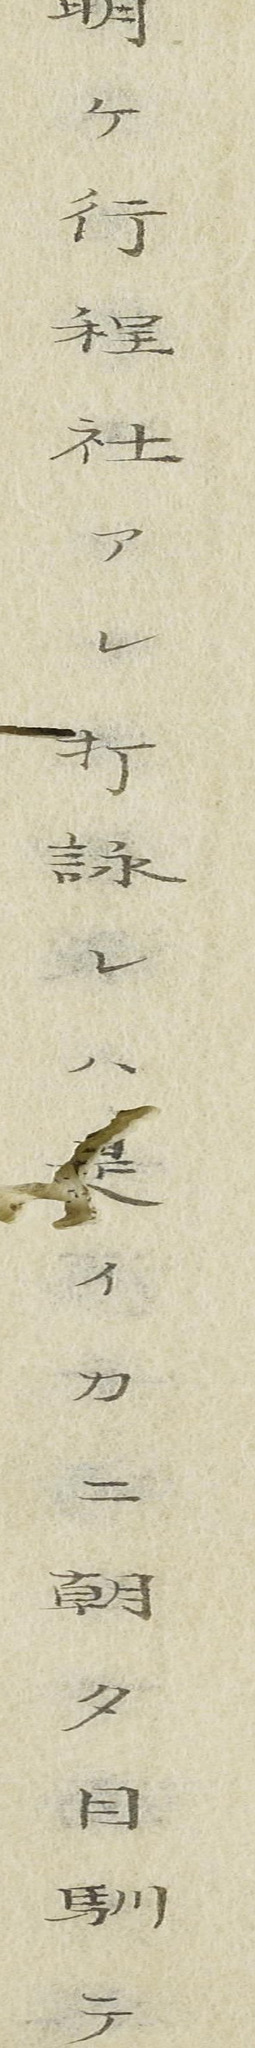明ケ行程社アレ打詠レハ是イカニ朝夕目馴テ

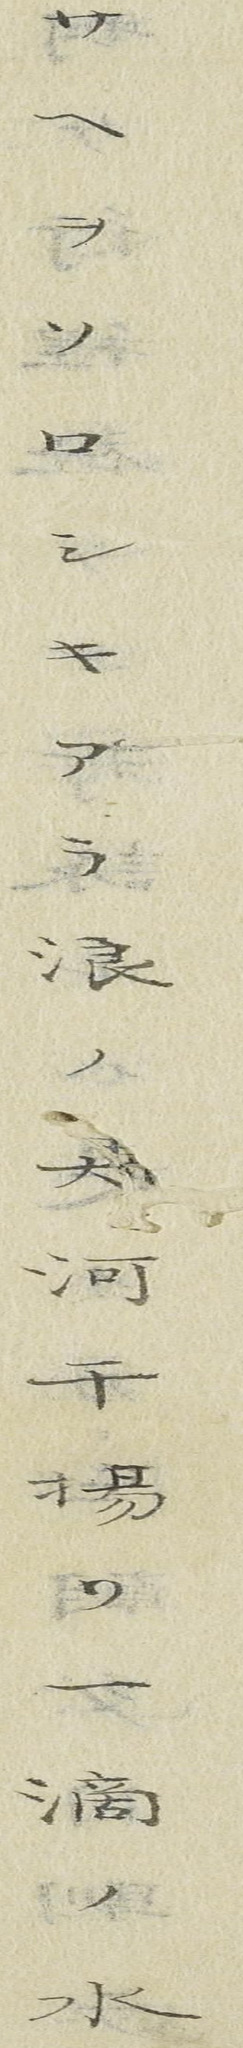サヘヲソロシキアラ浪ノ大河干揚リ一滴ノ水
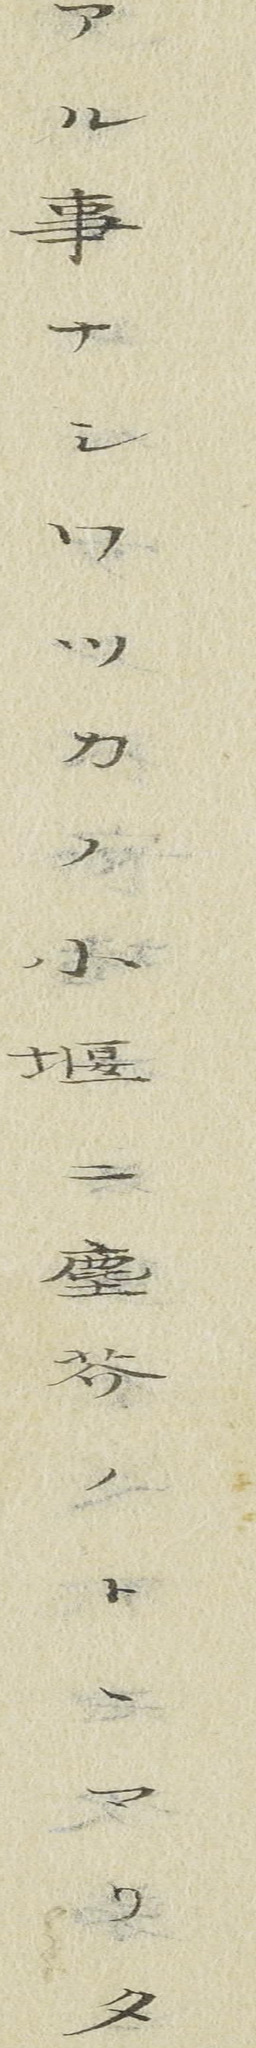アル事ナシワツカノ小堰ニ塵芥ノトヽマリタ
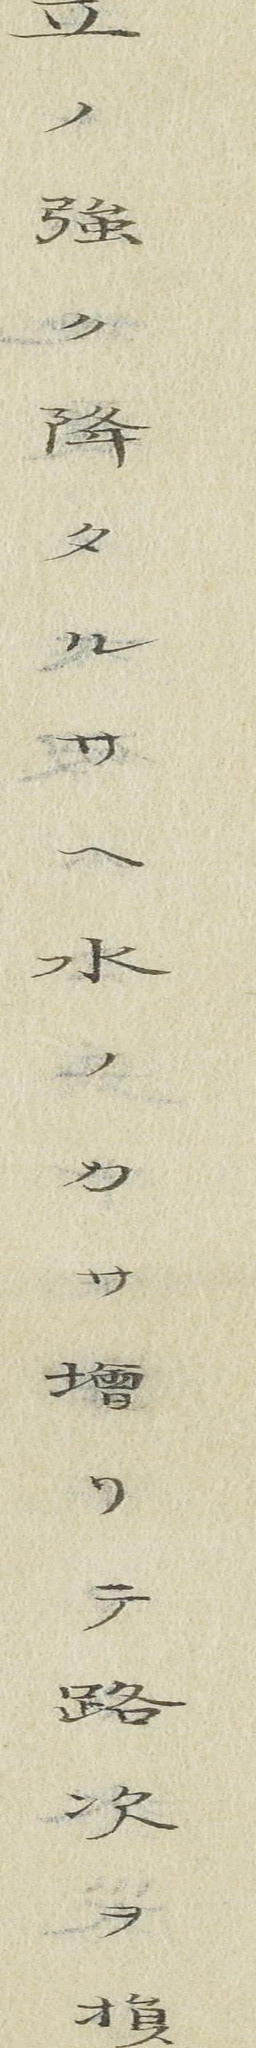立ノ強ク降タルサヘ水ノカサ増リテ路次ヲ損
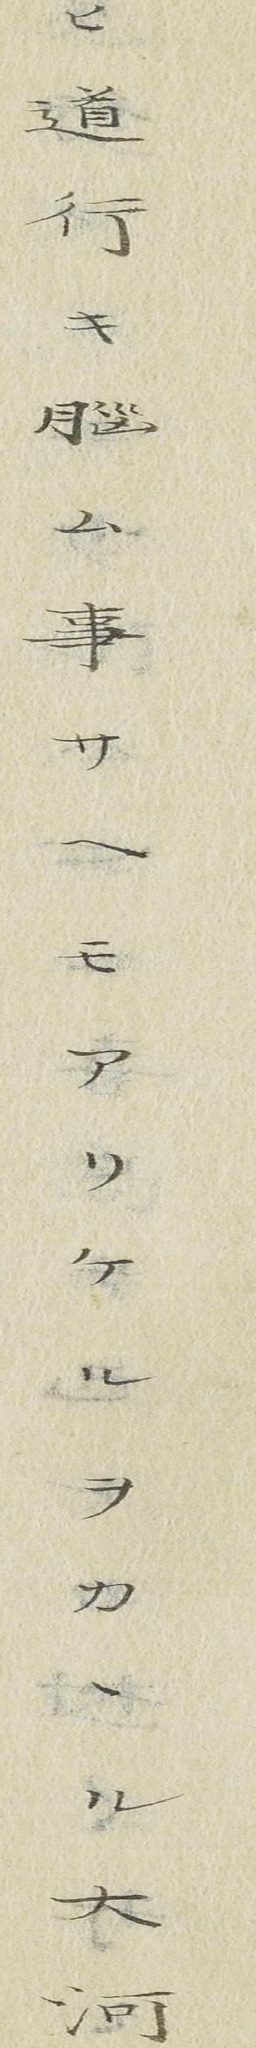ヒ道行キ脳ム事サヘモアリケルヲカヽル大河
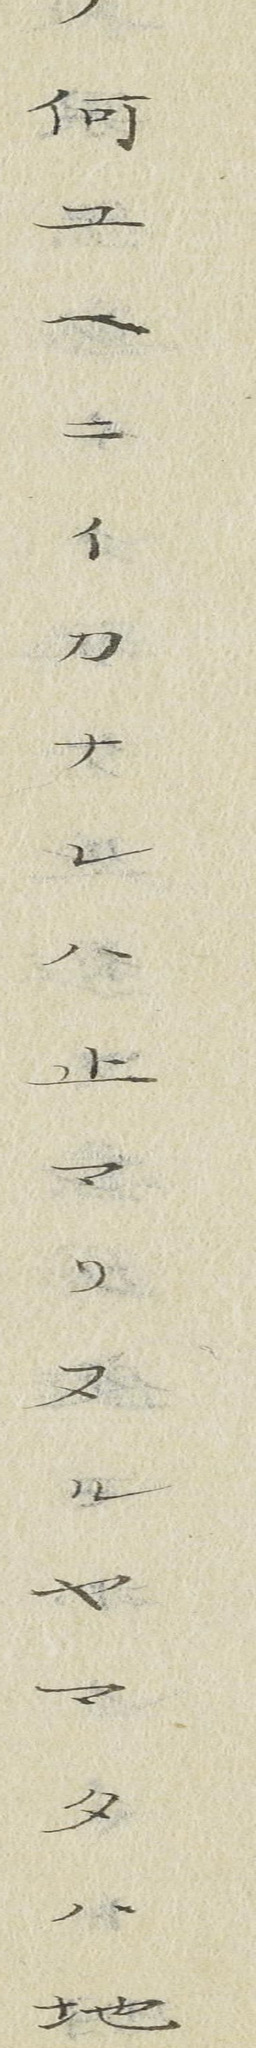ノ何ユヘニイカナレハ止マリヌルヤマタハ地
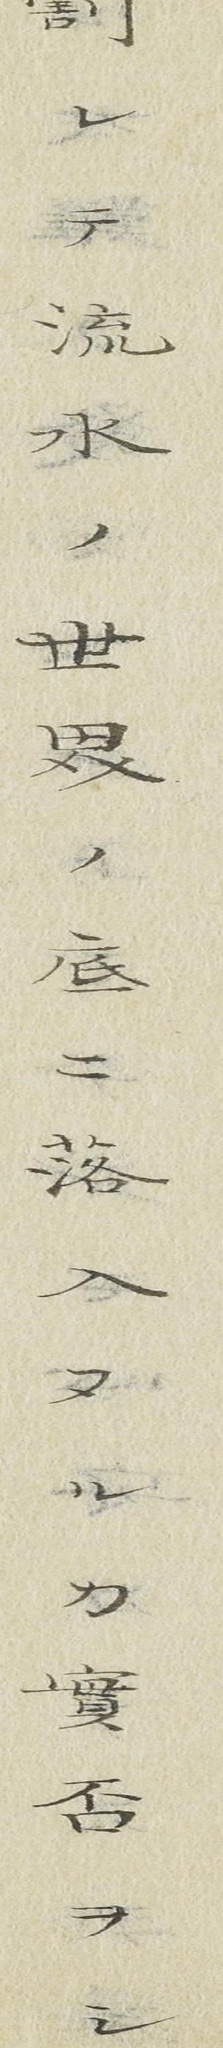割レテ流水ノ世界ノ底ニ落入ヌルカ実否ヲシ
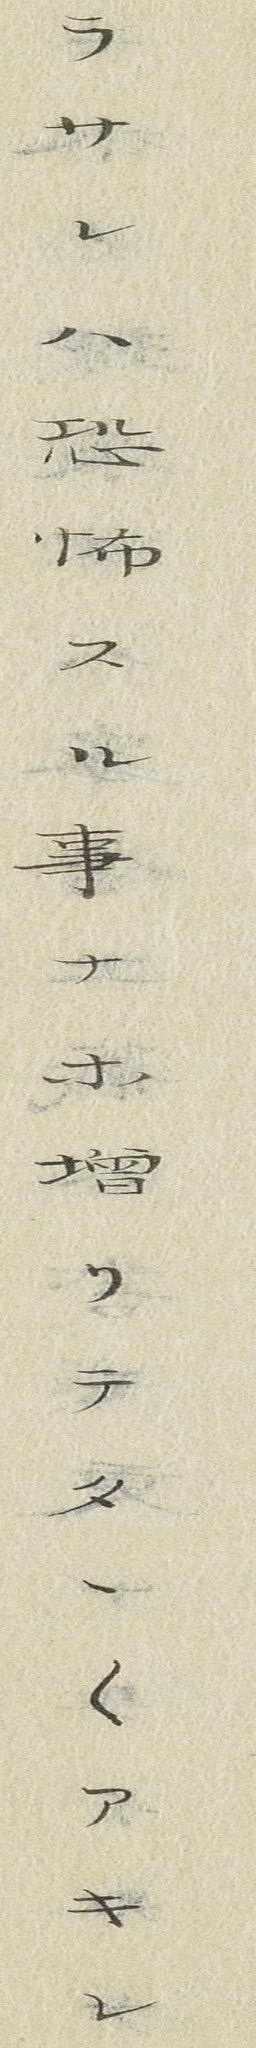ラサレハ恐怖スル事ナホ増リテタヽ〱アキレ
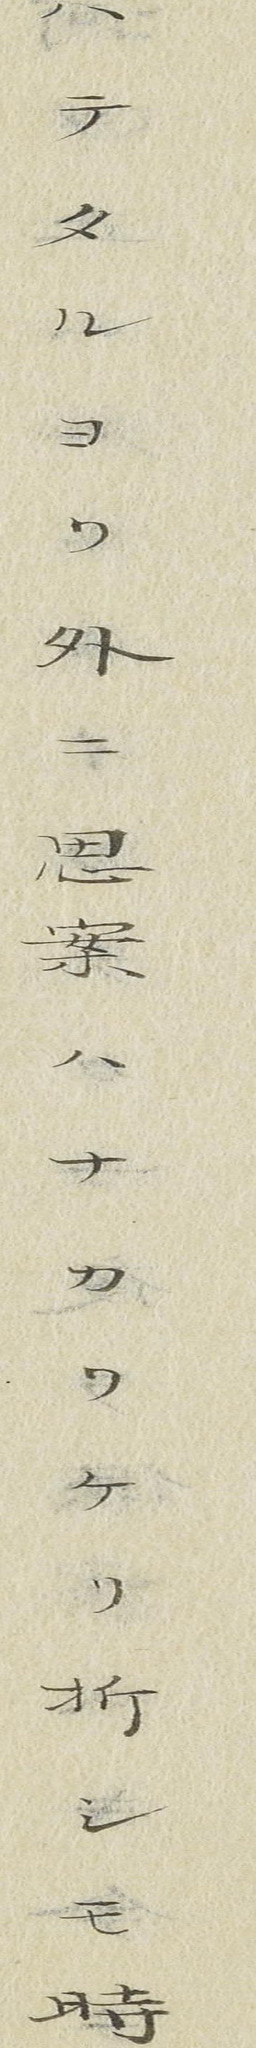ハテタルヨリ外ニ思案ハナカリケリ折シモ時
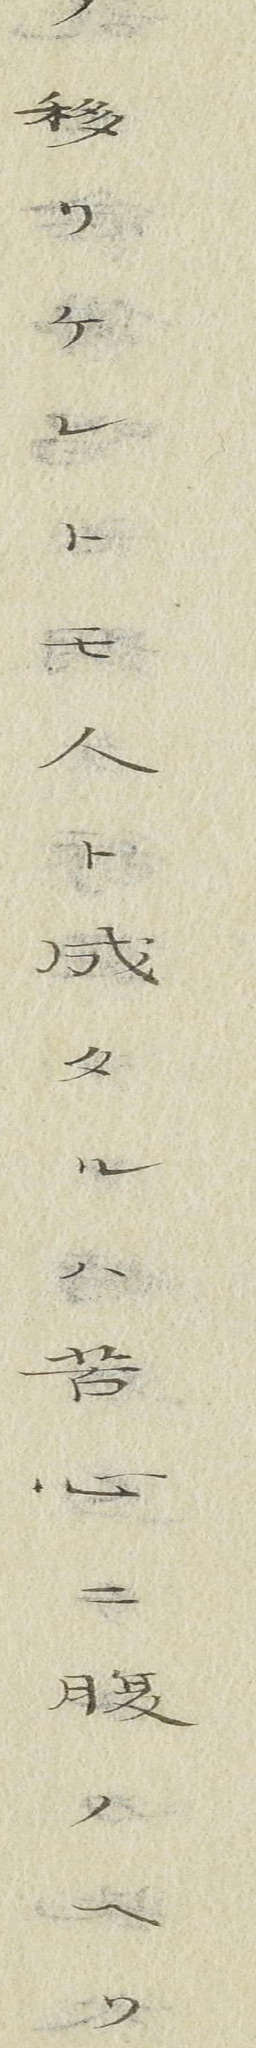ノ移リケレトモ人ト成タルハ苦心ニ腹ノヘリ
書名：地災撮要　地震之部　巻ノ二
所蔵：東京大学地震研究所図書室 Earthquake Research Institute Library, The University of Tokyo, JAPAN
